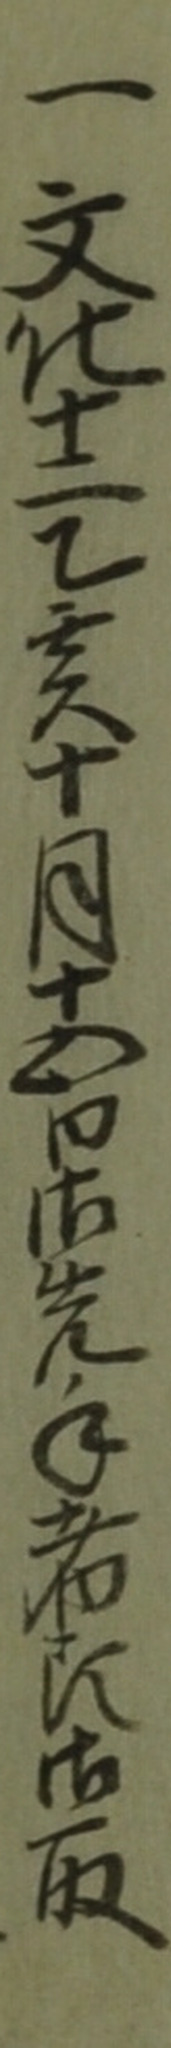一文化十二乙亥十月十五日御先手者頭御取
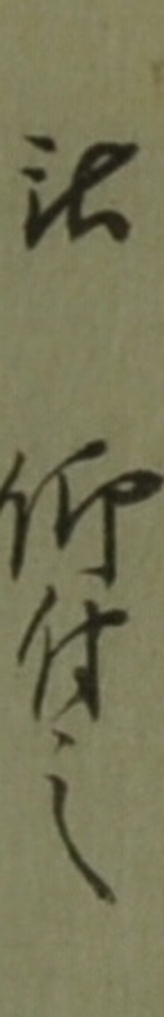被仰付之
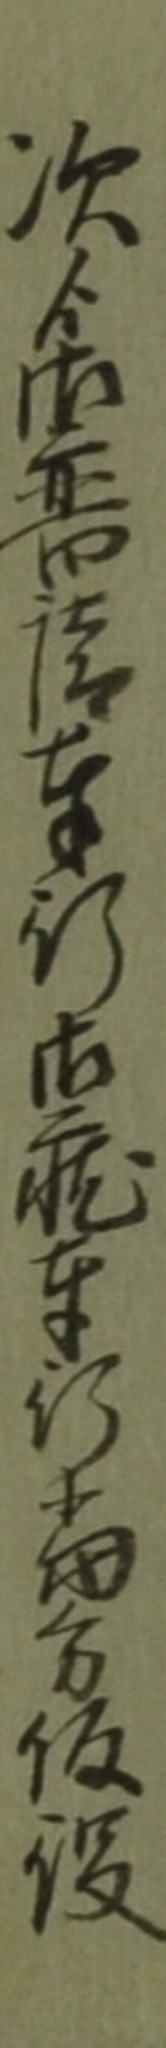次ゟ御普請奉行御蔵奉行当分仮役
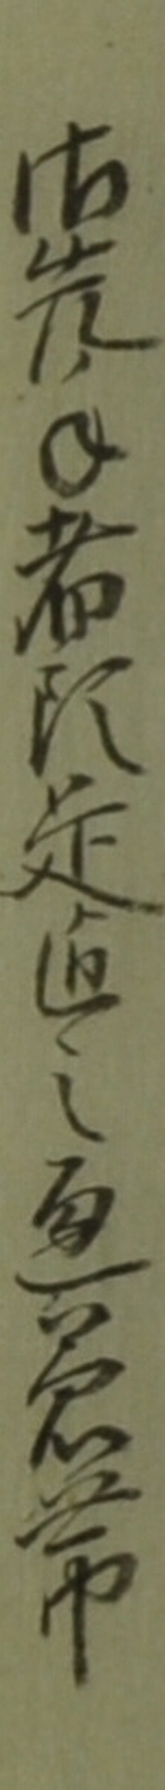御先手者頭是迄之通兼帯

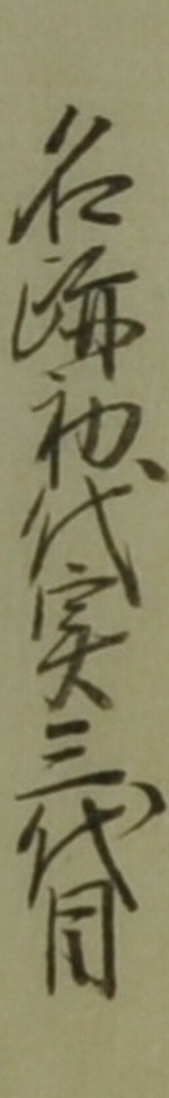名跡初代実三代目
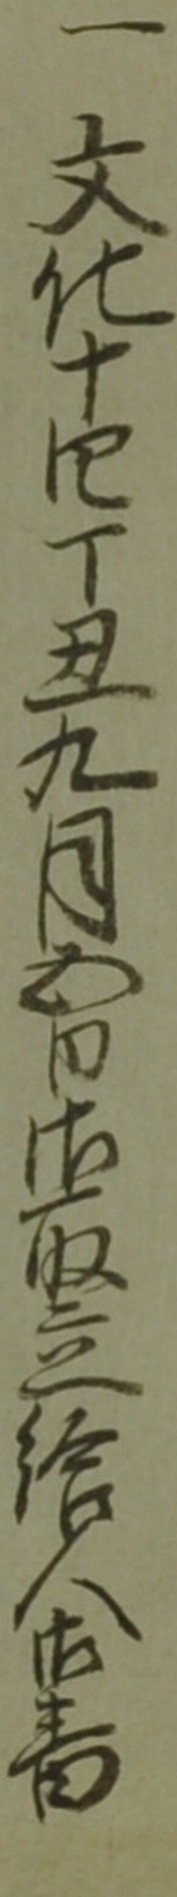一文化十四丁丑九月五日御取立給人御番
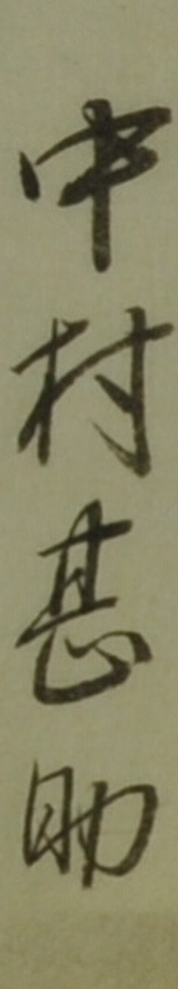中村甚助
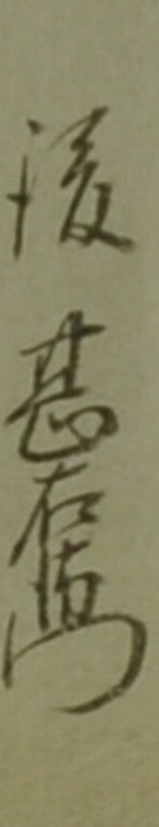後甚右衛門
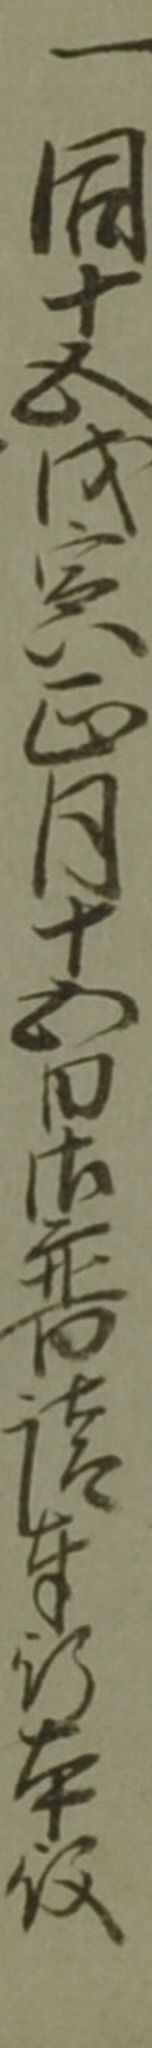一同十五戊寅正月十五日御普請奉行本役
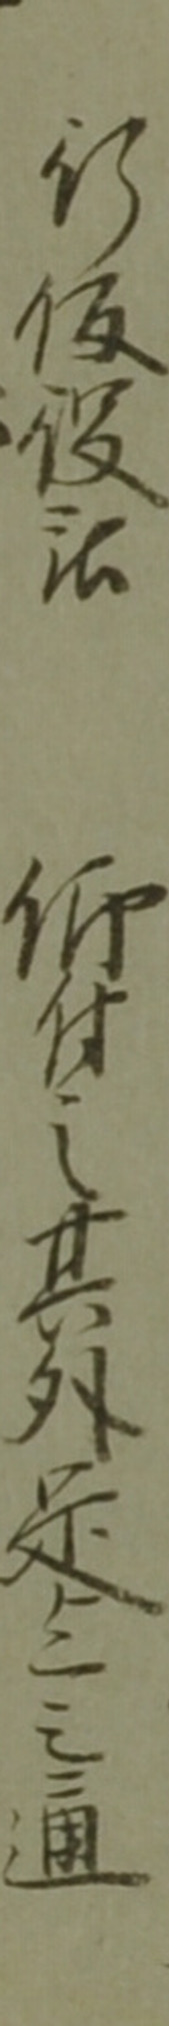行仮役被仰付之其外是迄之通
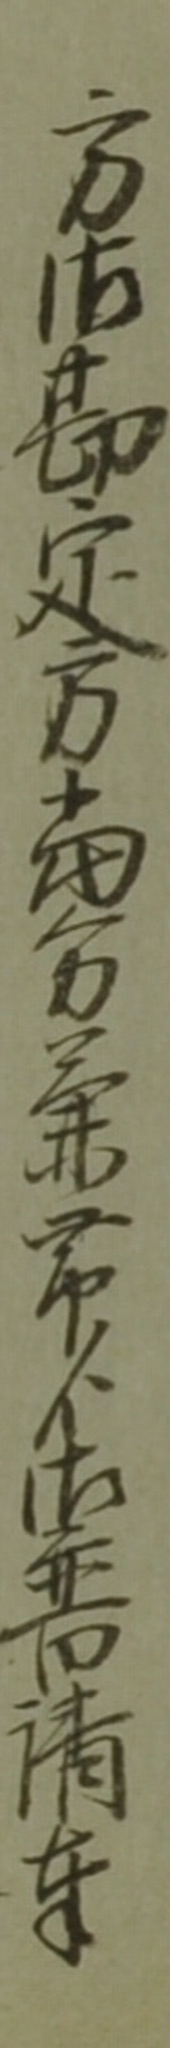方御勘定方当分兼帯ゟ御普請奉
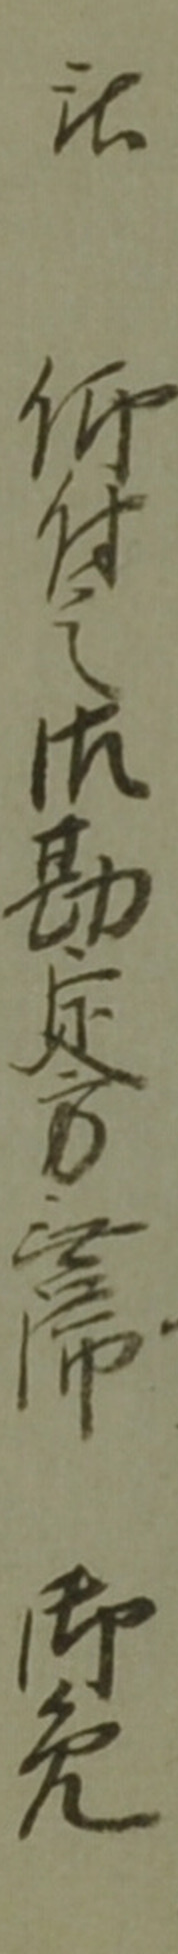被仰付之御勘定方無滞御免
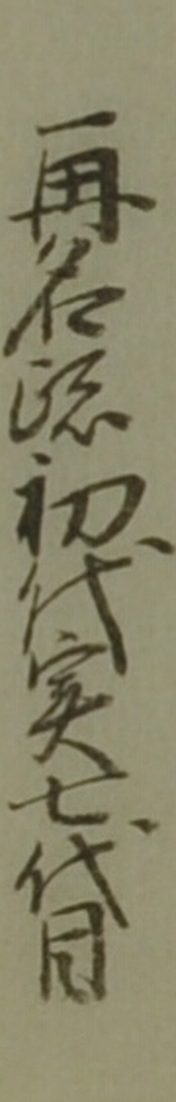再名跡初代実七代目
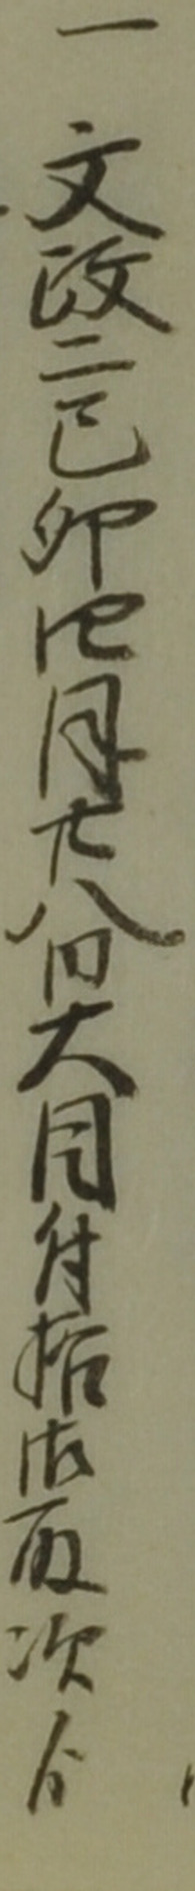一文政二己卯四月廿八日大目付格御取次ゟ
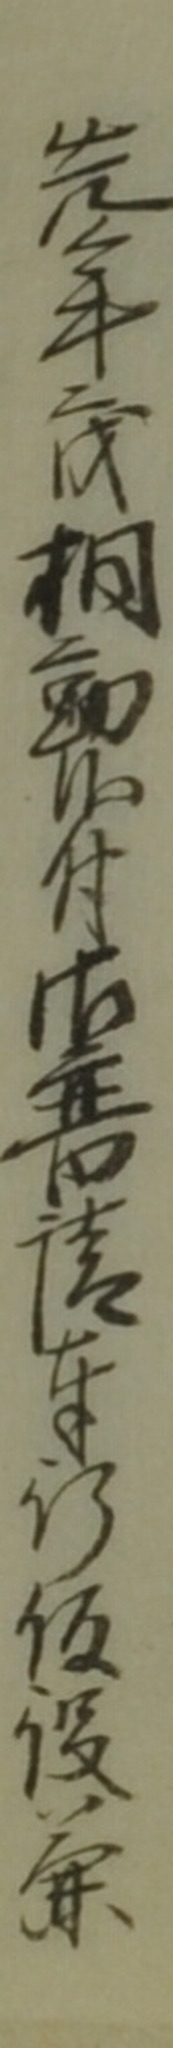先年茂相勤候付御普請奉行仮役兼
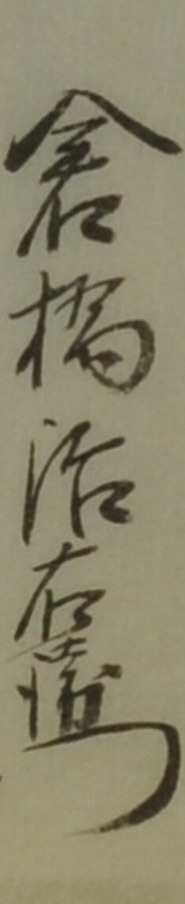倉橋治右衛門
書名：諸御役代々録（六）
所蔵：伊那市立高遠町図書館・合同会社AMANE
